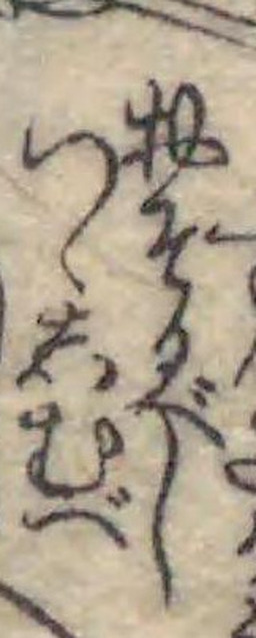つゝしむべ
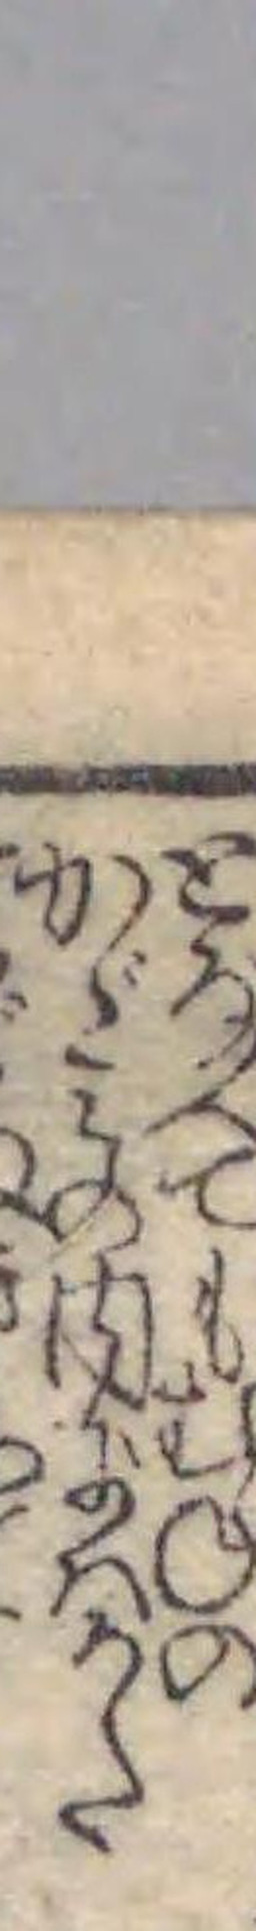かゞみの内にはかた
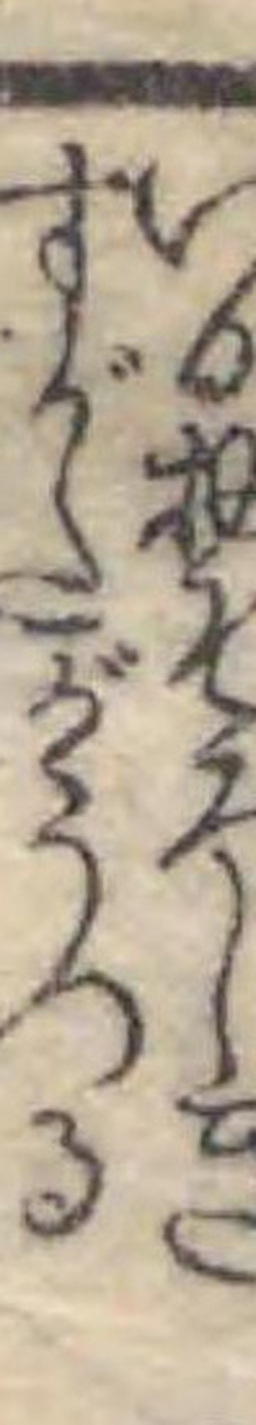すがたがうつる
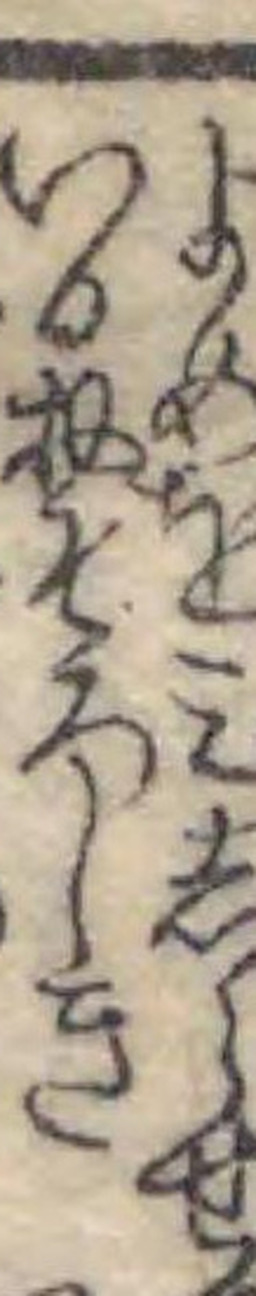いるおそろしき
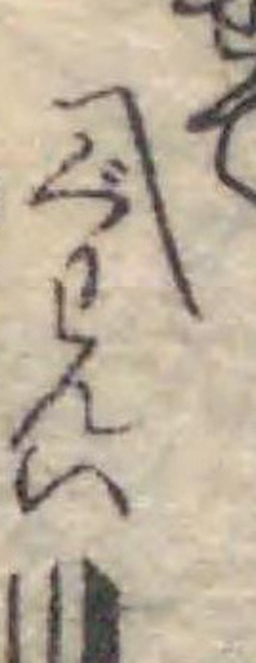〽ぐわんい
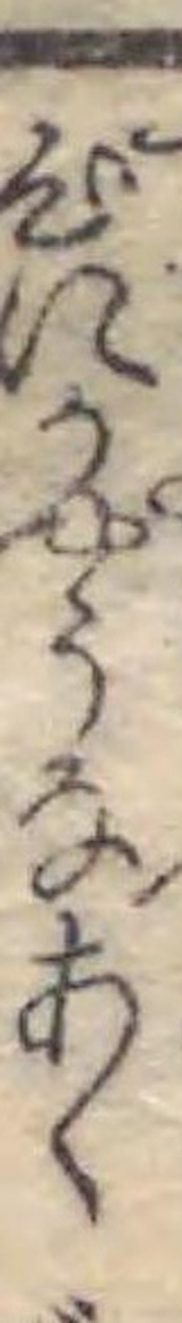心にかやうなあく
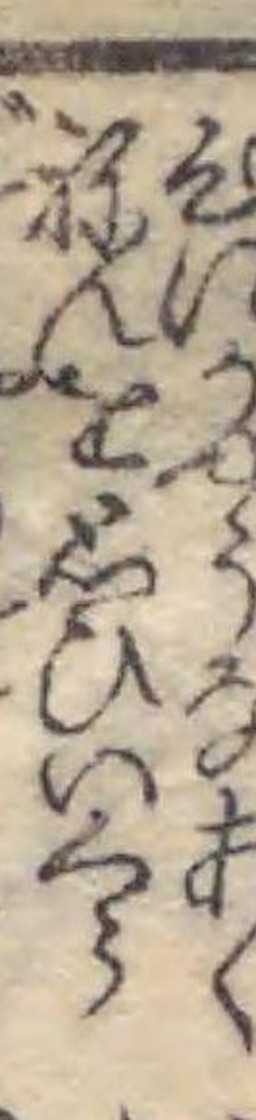ねんを思ひいくら
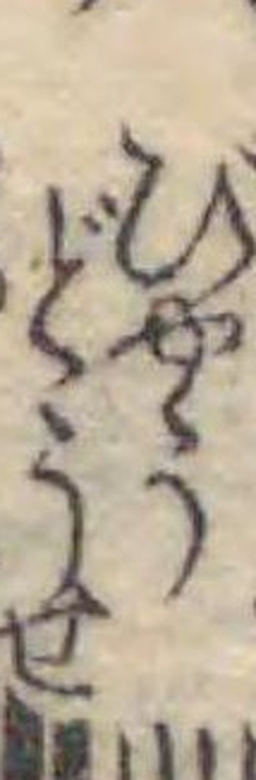どうせ
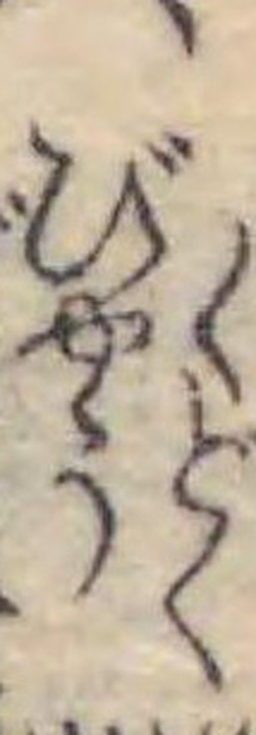びやう
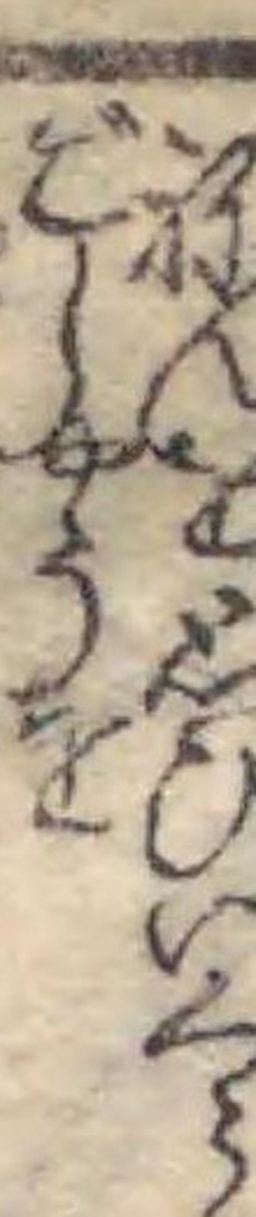ごしやうを
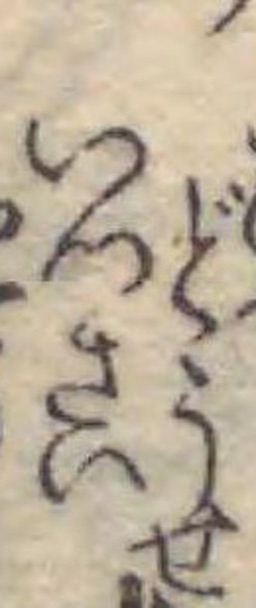いつさい
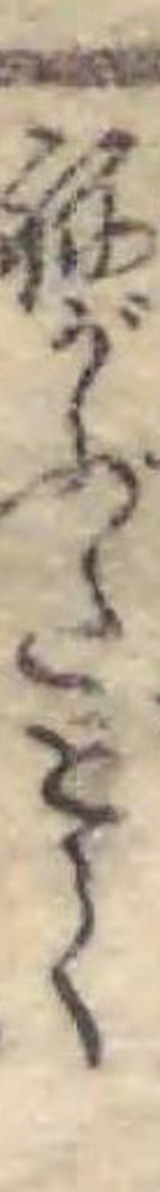ねがふたとて
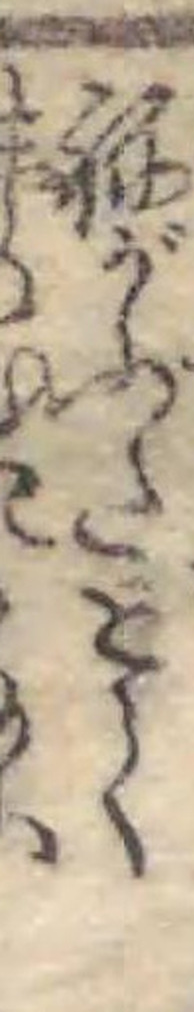ねがふたとて
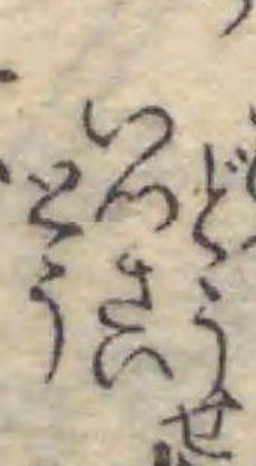いつさい
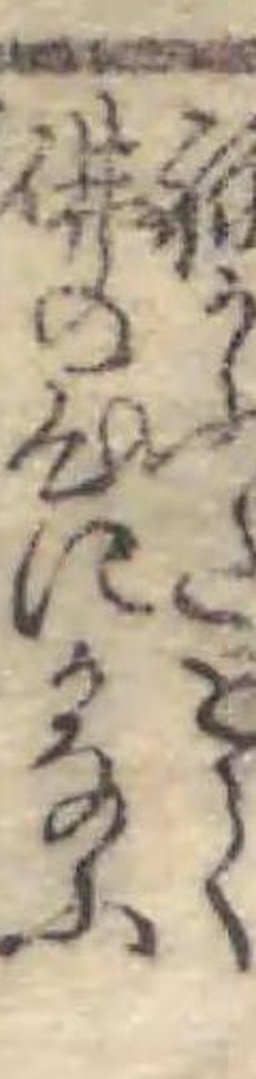仏の心にかなふ
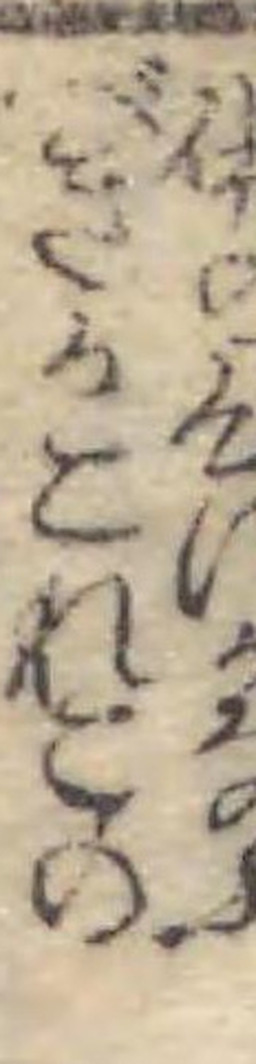べきかこれこの
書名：人心鏡写絵 : 3巻
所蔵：国立国会図書館 National Diet Library, JAPAN
